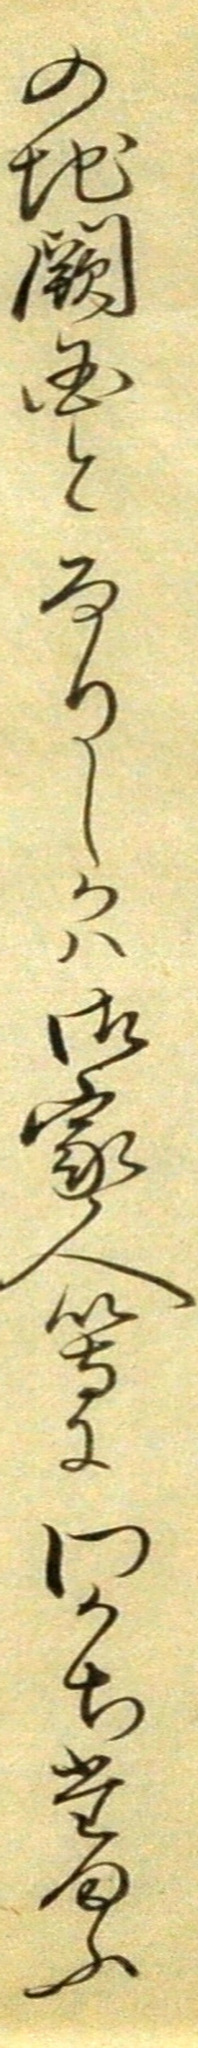の地闕国となりしかは御家人等にわかちたまふ
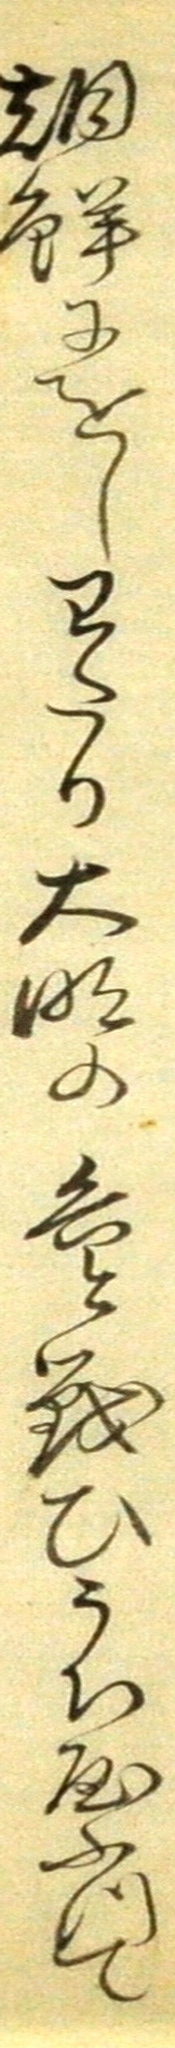朝鮮にをしわたり大明の兵と戦ひうちやふつて
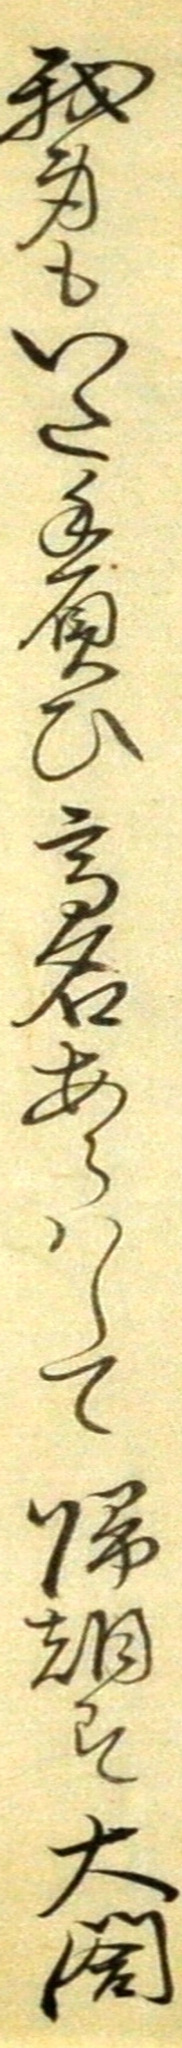我身もいた手負ひ高名あらはして帰朝す太閤
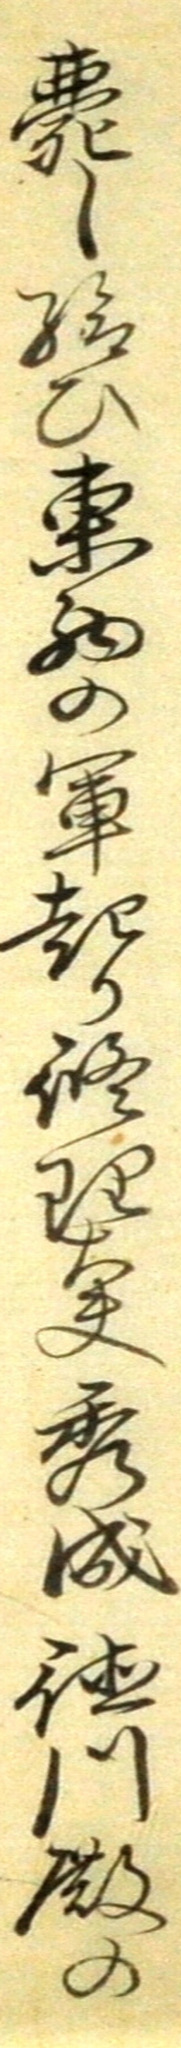薨し給ひ東西の軍起り修理大夫秀成徳川殿の
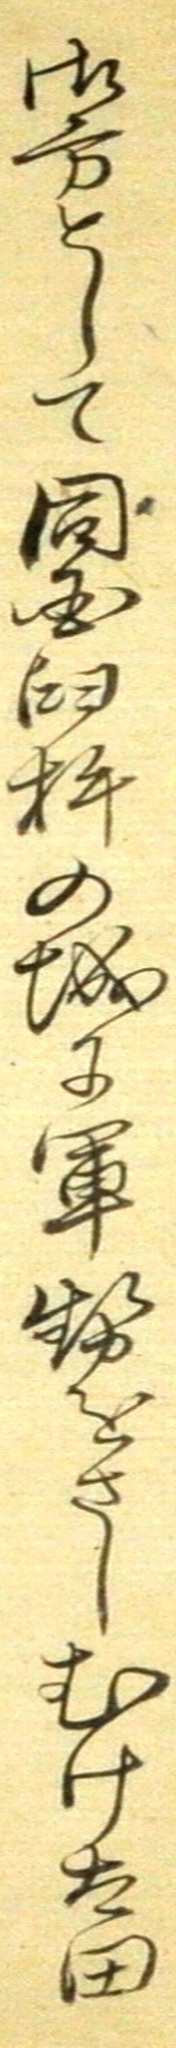御方として同国臼杵の城に軍勢をさしむけ太田
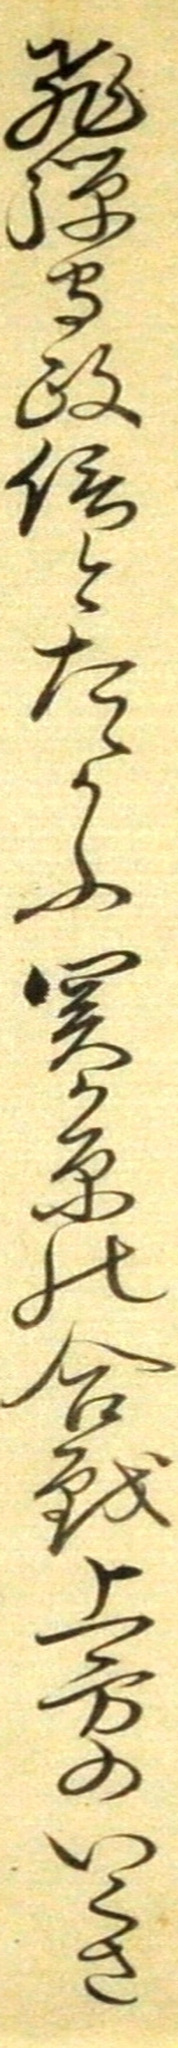飛騨守政信とたゝかふ関か原の合戦上方のいくさ
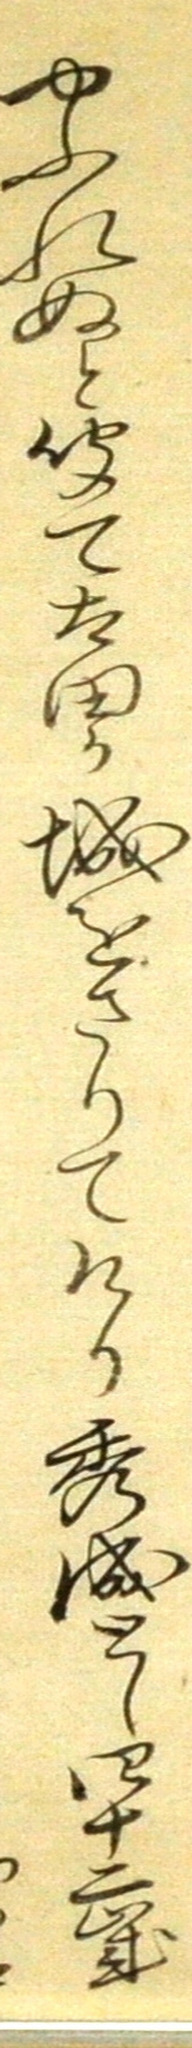やふれぬと聞て太田か城をさりてけり秀成とし四十二歳
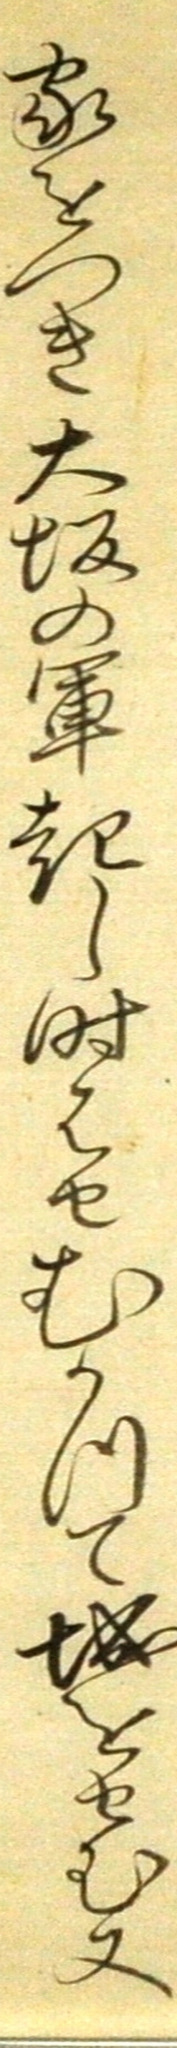家をつき大坂の軍起し時はせむかつて城をせむ又
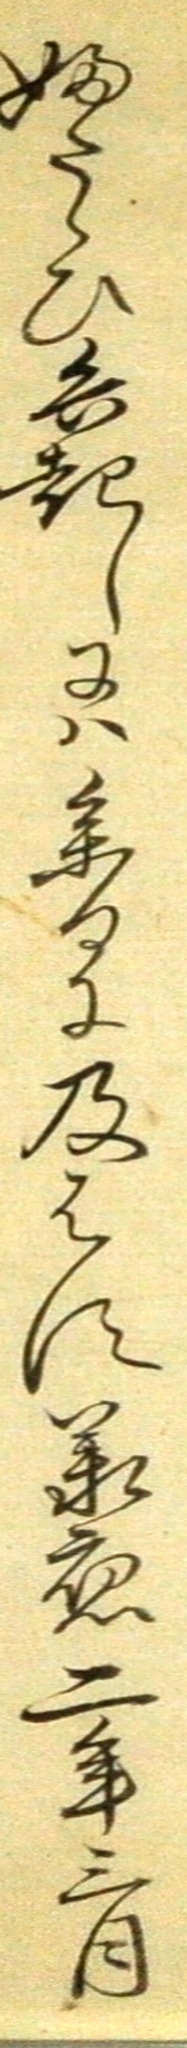ふたゝひ兵起しには参るに及はす承応二年三月
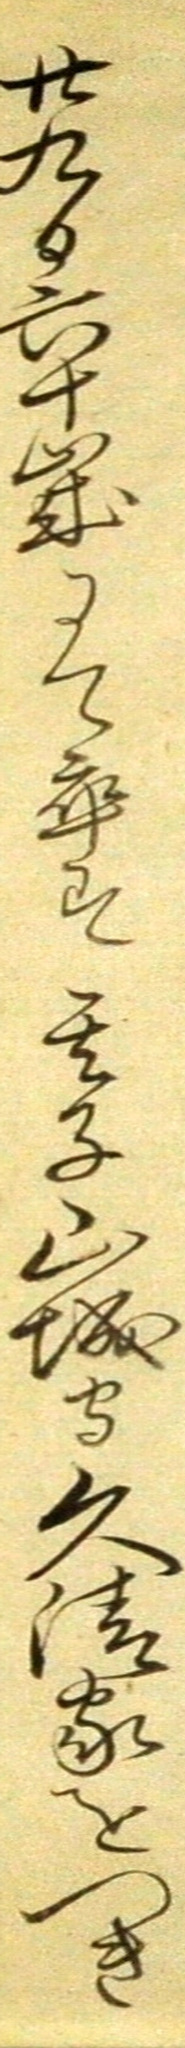廿九日六十歳にて卒す其子山城守久清家をつき
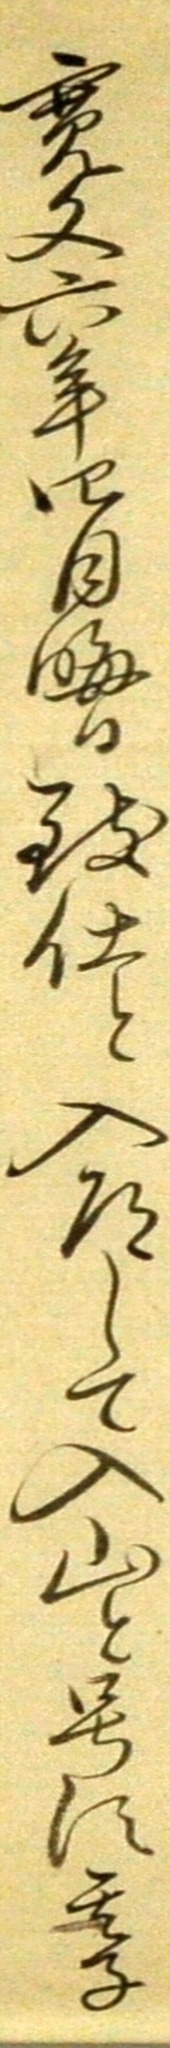寛文六年四月晦日致仕と入道して入山と号す其子
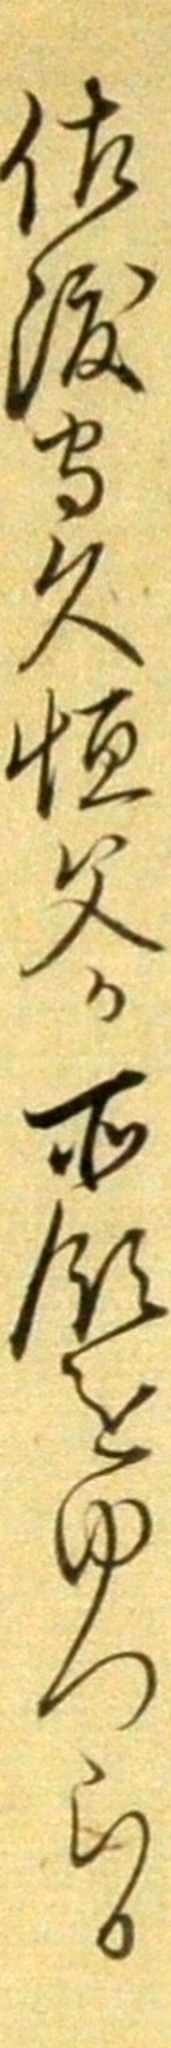佐渡守久恒父か所領をゆつらる

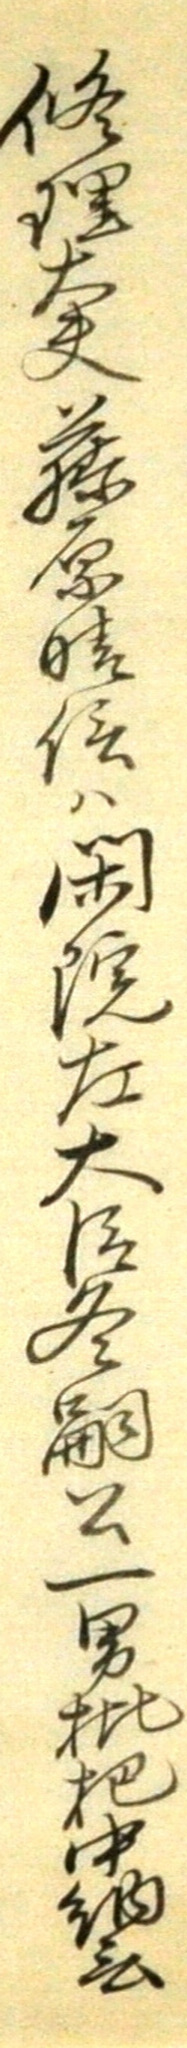修理大夫藤原晴信は閑院左大臣冬嗣公一男枇杷中納言
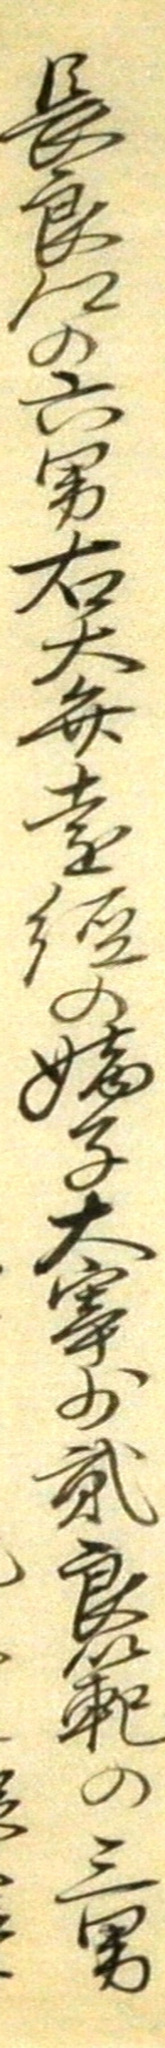長良卿の六男右大弁遠経の嫡子太宰少弐良範の三男
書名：藩翰譜（九・下）
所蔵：伊那市立高遠町図書館・合同会社AMANE
